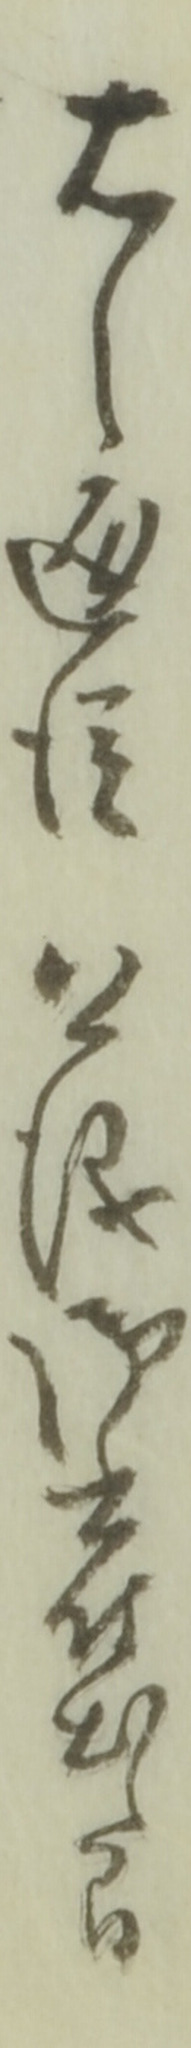右之通従公儀御書付候間
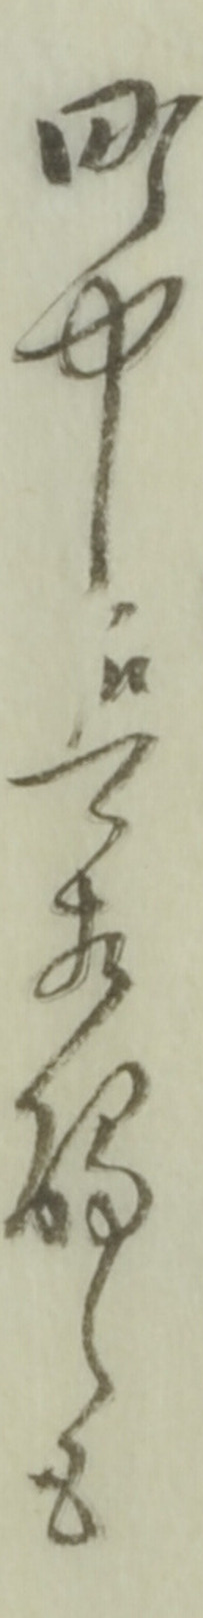町中え相触候以上
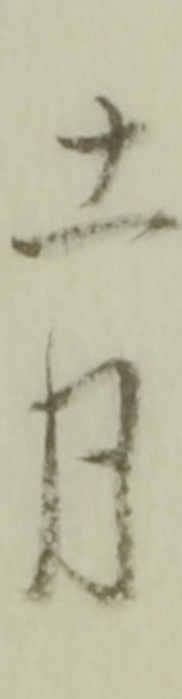十一月
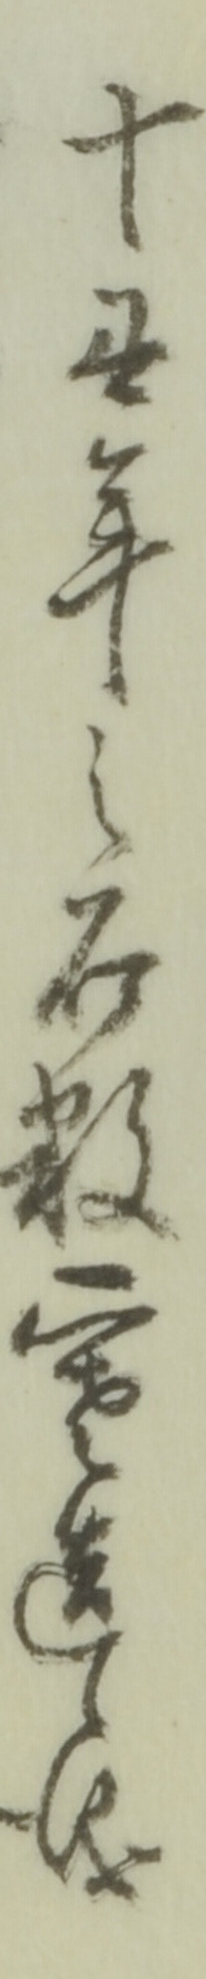十年之石数宛り造候儀
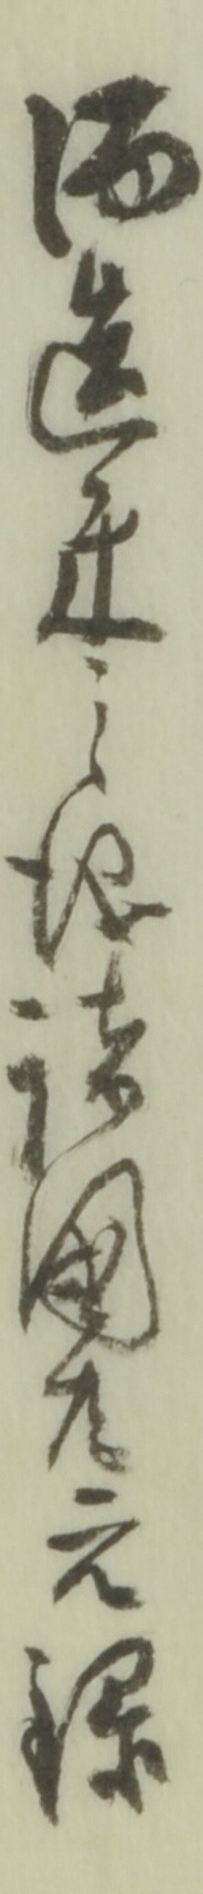酒造辻之儀諸国共元禄
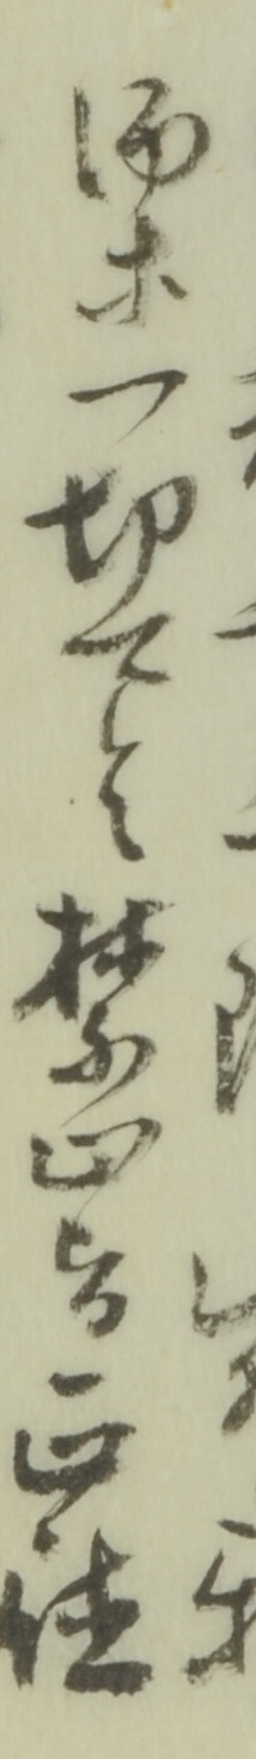酒等一切可令禁止旨正徳
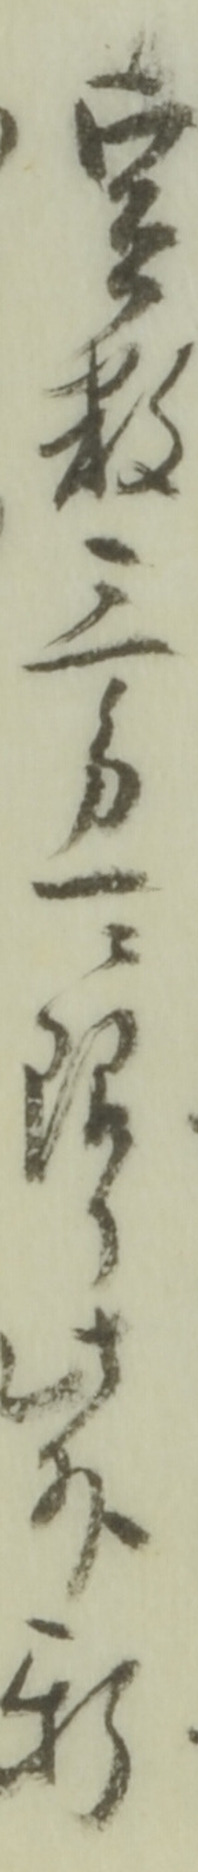定数三方一二限り此外新
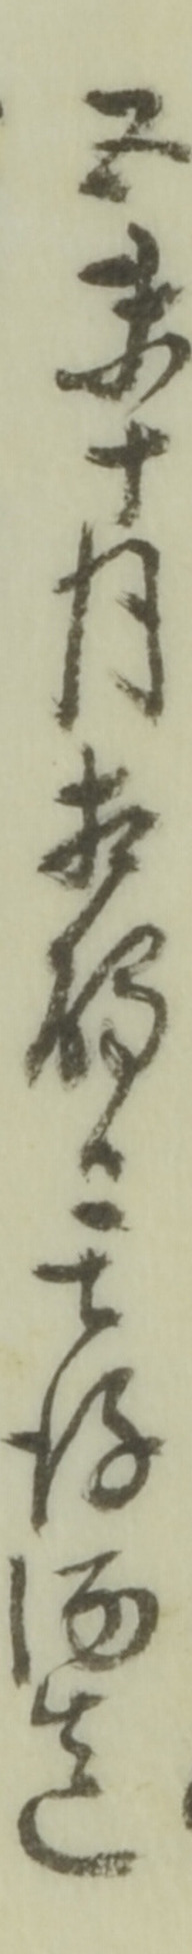五未十月相触候其後酒造
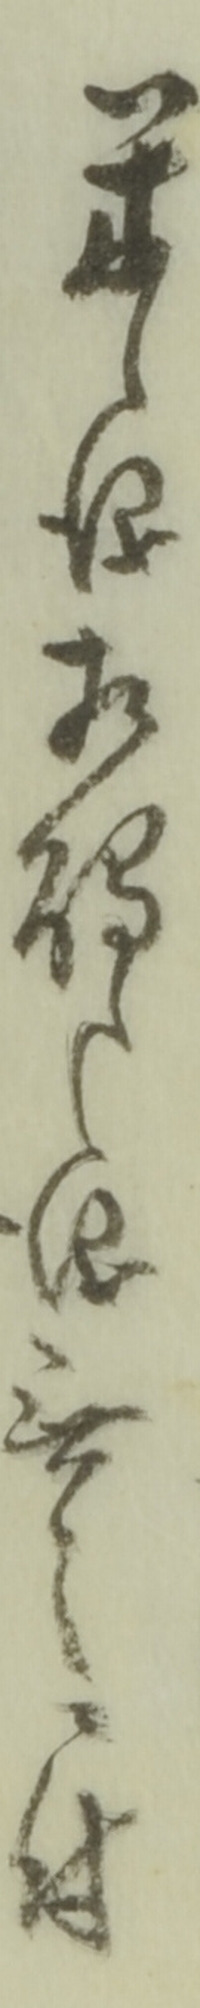米之儀相触候儀無之二付
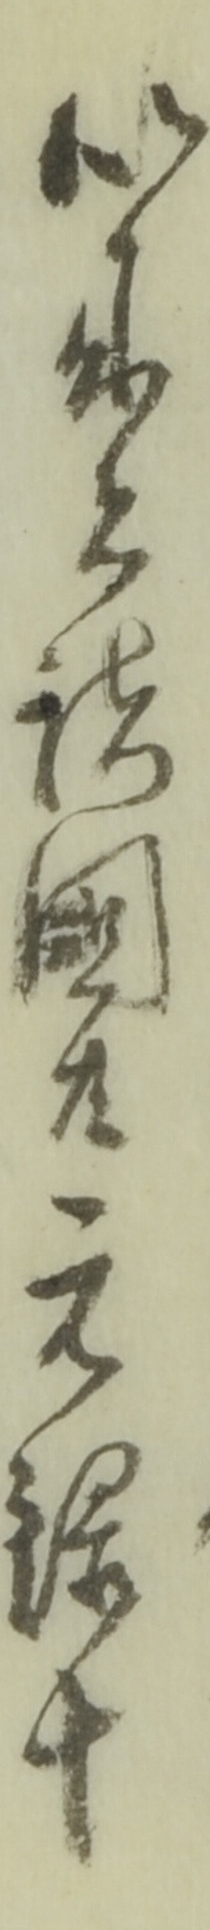以来者諸国共元禄十
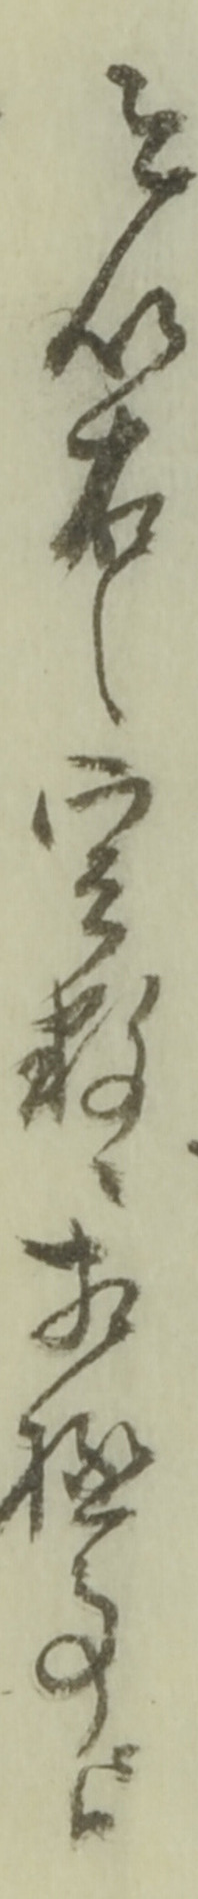を以右之定数へ相極候事二而

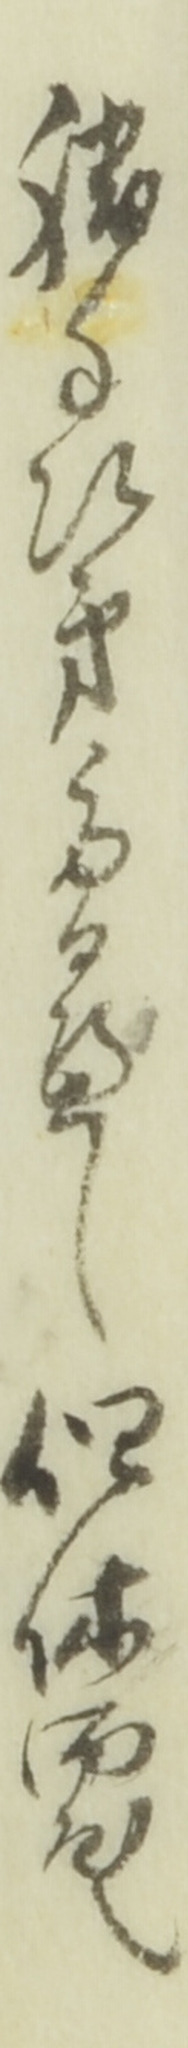勝手次第たるべし但休酒屋之
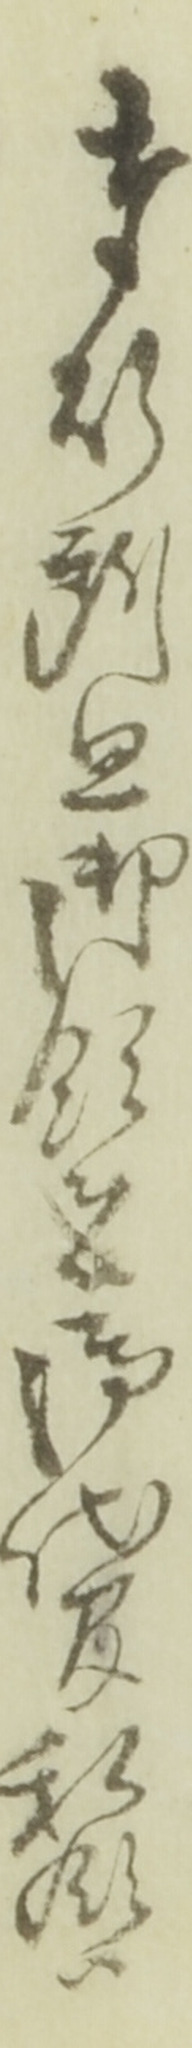奉行所且御領者御代官私領ハ
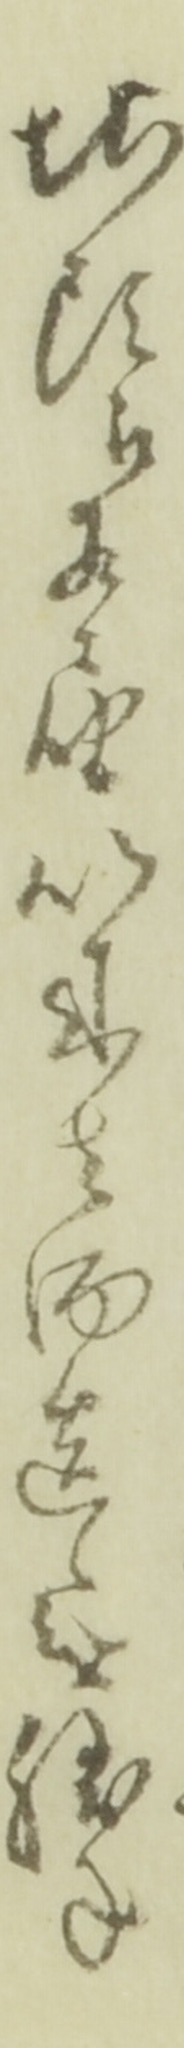地頭え相届以来者酒造候義勝手
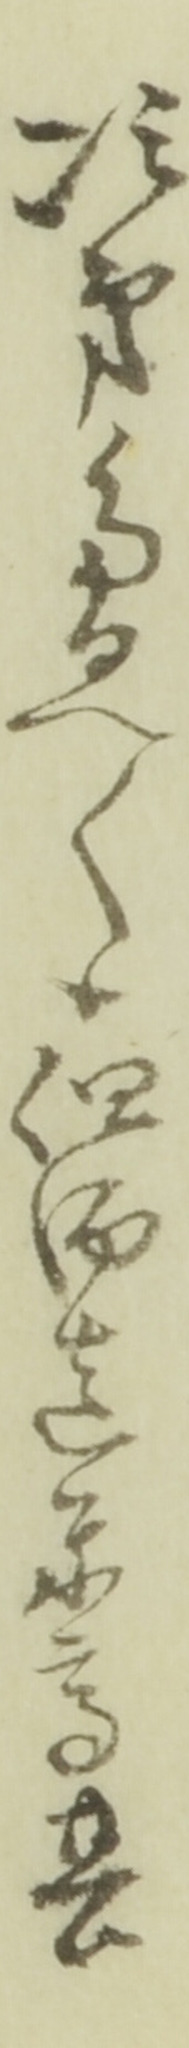次第たるへく候但酒造迄米高其
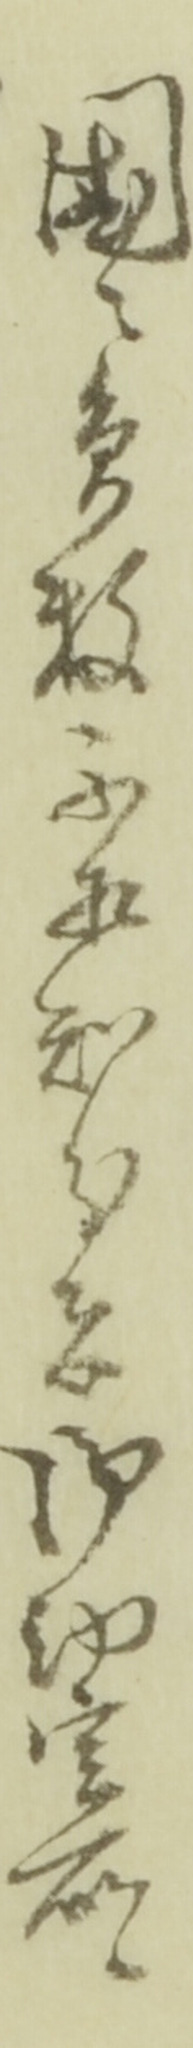国々員数不相知分者御納定所へ
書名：御公儀様御領主様御触書控
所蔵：伊那市立高遠町図書館・合同会社AMANE
